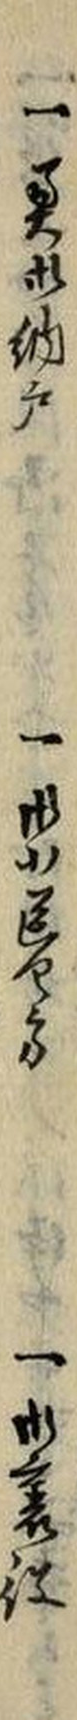一奥御納戸一御小道具方一御裏役
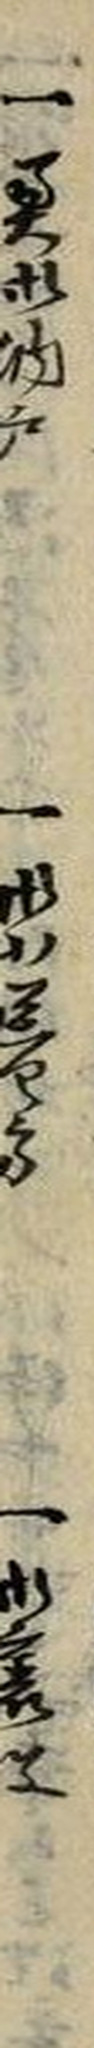一奥御納戸一御小道具方一御裏役
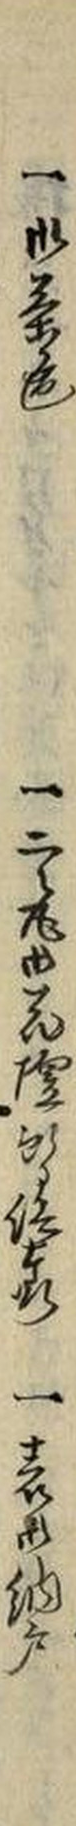一御茶道一二之丸御花壇預り絵奉行一表御納戸
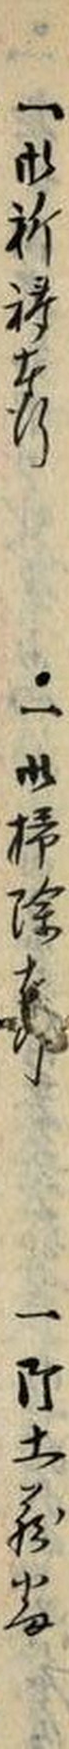一御祈祷奉行一御掃除奉行一御土蔵番
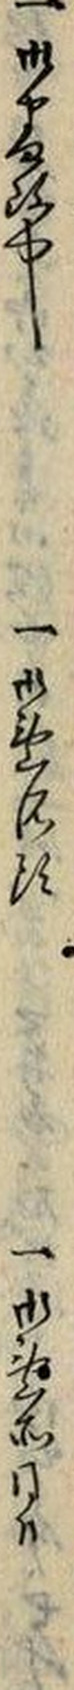一御番改中一御台所頭一御台所目付
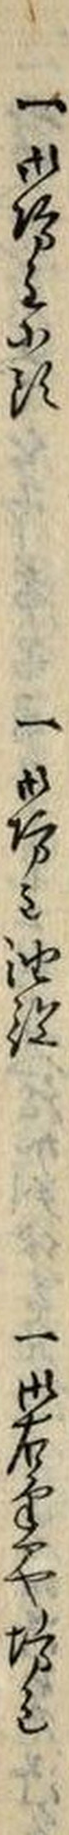一御坊主小頭一御坊主油役一御右筆部や坊主
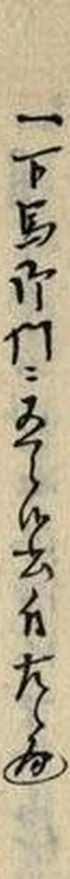一下馬御門ニ有之候書付左之通
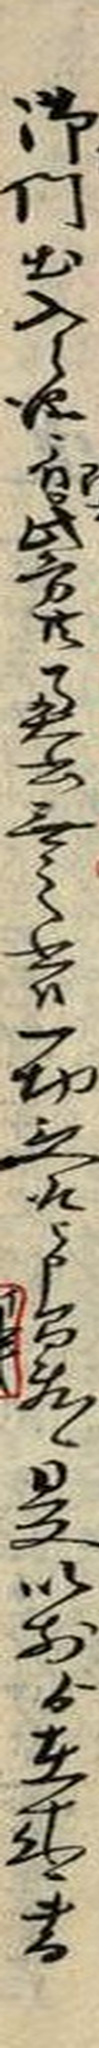御門出入之儀ニ付此方共奥書無之書付一切受取申間敷候且又以前ゟ在来候書
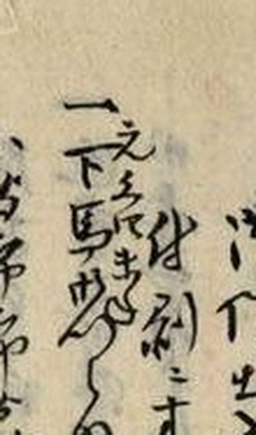元文四未年
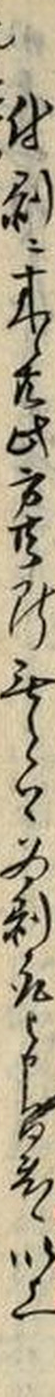付剥ニ来候共此方共断無之候ハヽ剥取被申間敷候事以上目付中
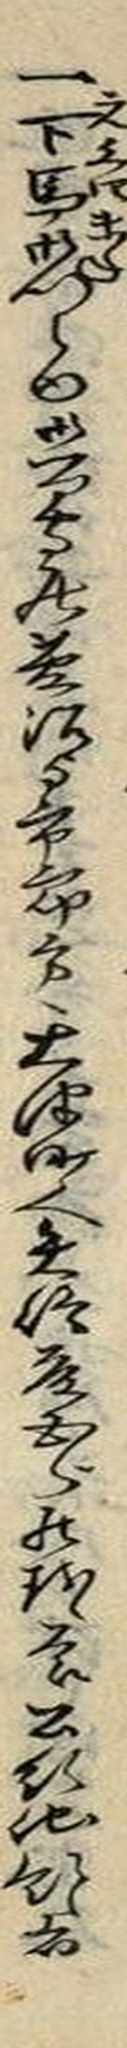一下馬御門之内御留守居菅沼与市郎方へ大津町人矢嶋藤五郎罷越候節公領他領之者
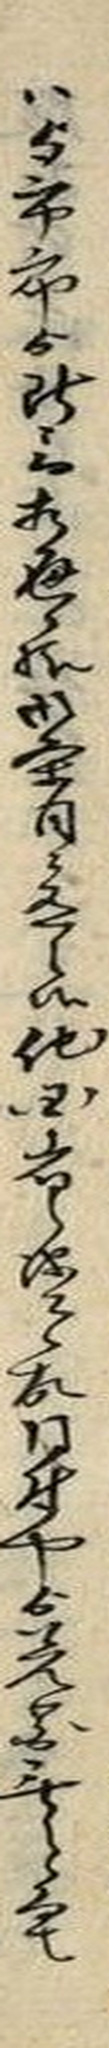ハ与市郎ゟ断ニ而相通候様御条目ニ有之候他国者之儀ニ候故目付中ゟ差図無之候而は
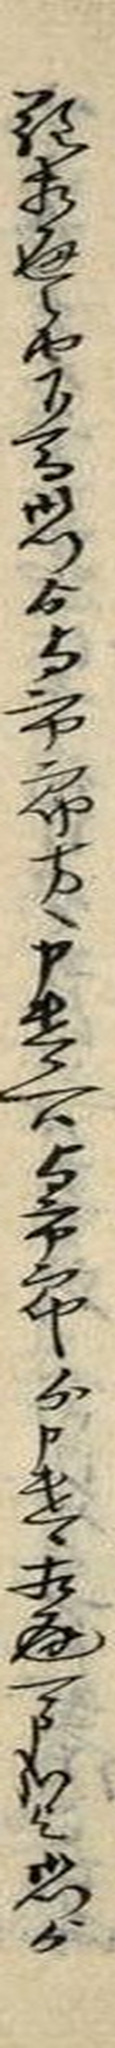難相通候由下馬御門ゟ与市郎方へ申遣候へハ与市郎ゟ申遣相通可申哉と御門ゟ
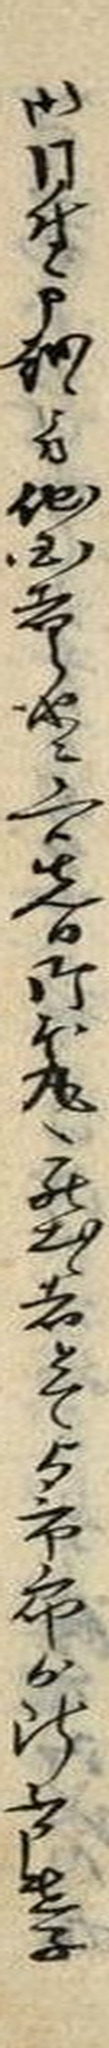御目付へ申越候ニ付他国者之儀ニ候へハ先日御本丸へ罷出候者とて与市郎ゟ断不申遣子
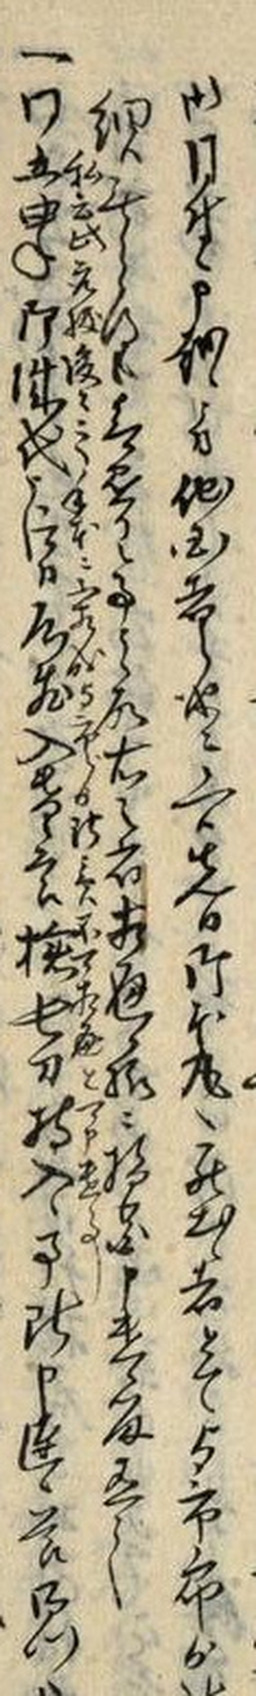細ハ無之候得共参懸り之事之故右之者相通候様ニ指図申遣候留有之
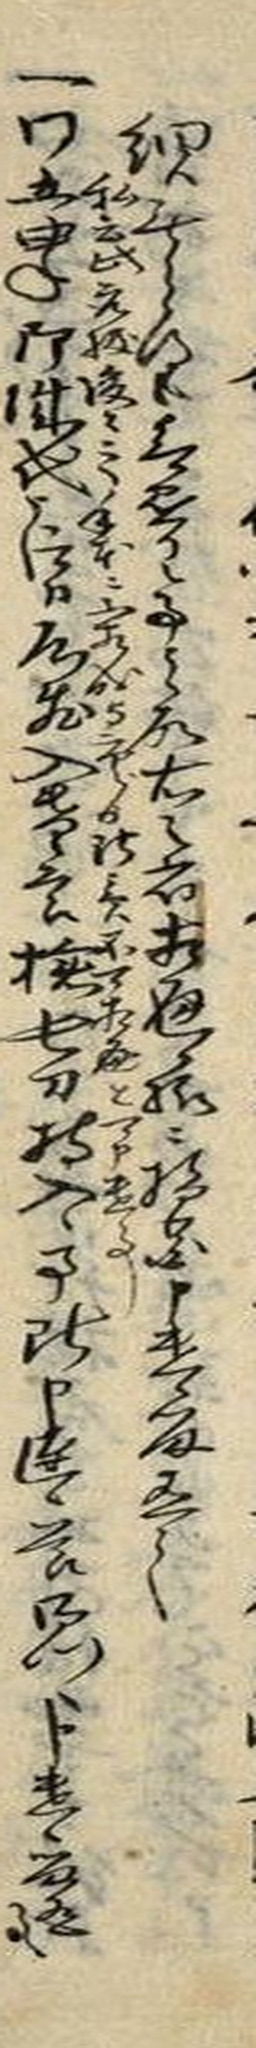一同五申年御城代被仰付屋敷入替之節槍長刀持入候事断申達候節御門へ申達候留有之
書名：御門御櫓之部
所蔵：福井県文書館 Fukui Prefectural Archives
